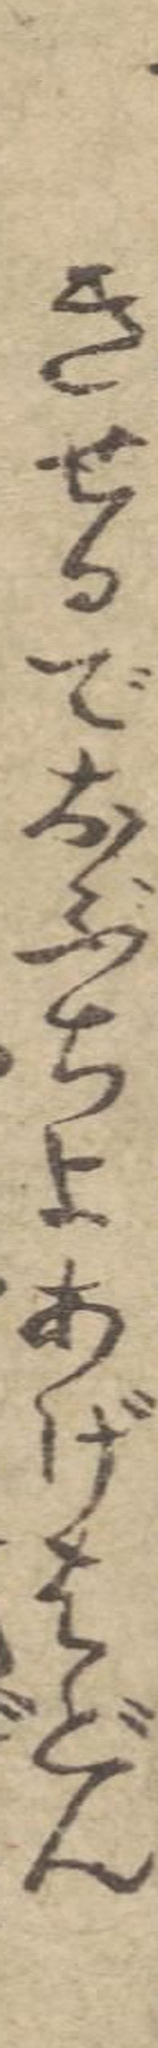きせるでおぶちよあげはどん
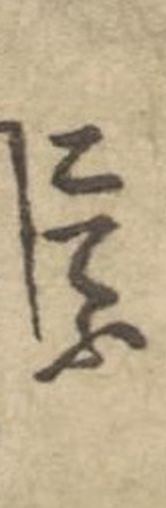こてふ
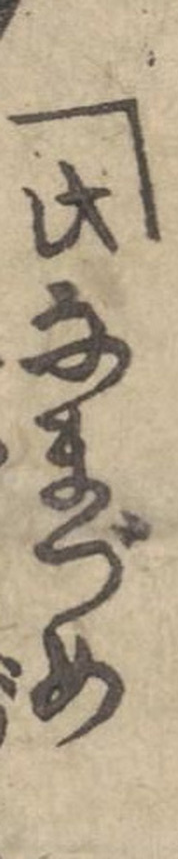〽此なまづめ
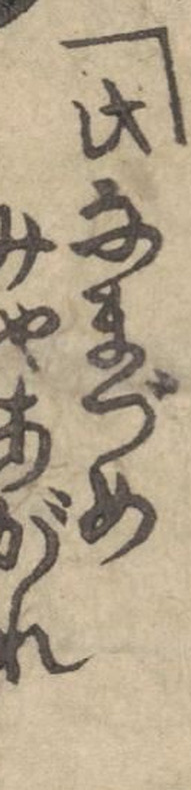〽此なまづめ
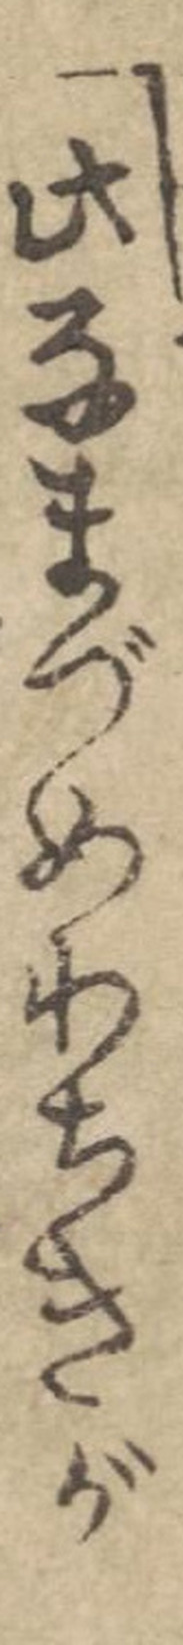〽此なまづめわちきが
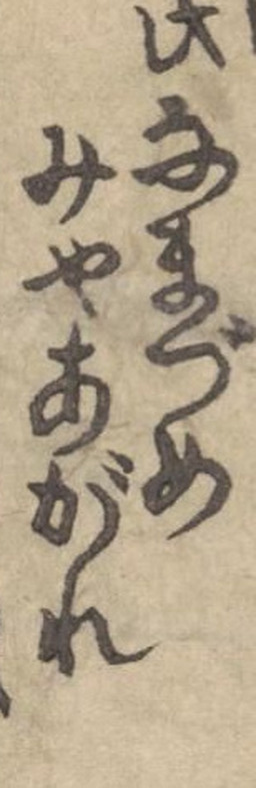みやあがれ
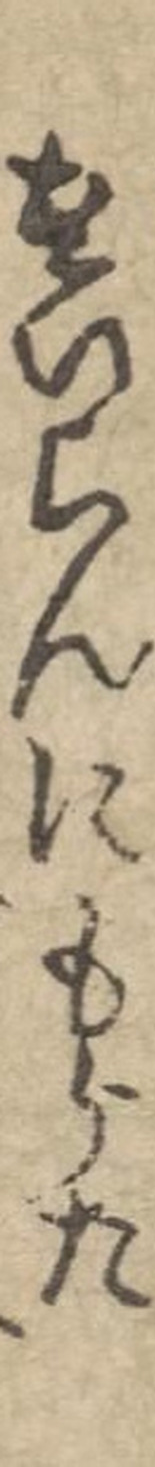をいらんにもらた
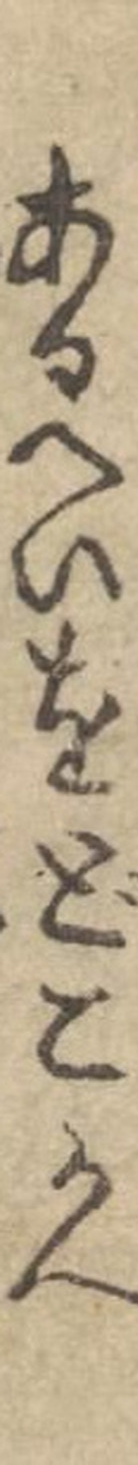あるへいをどこかへ
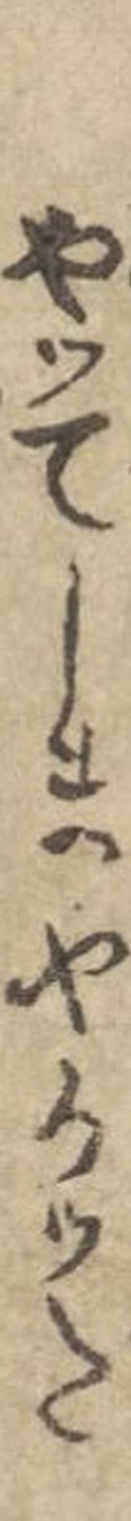やつてしまやかつた
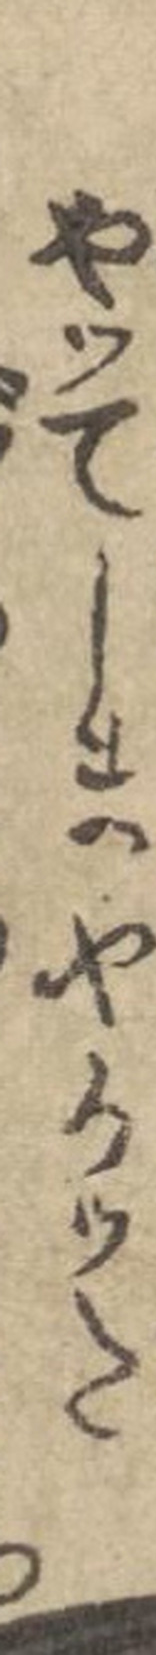やつてしまやかつた
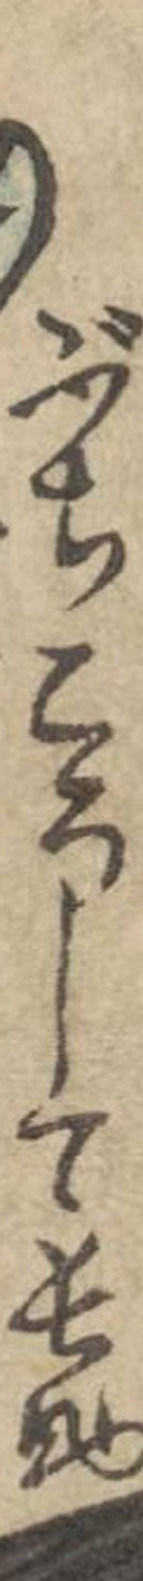ぶちころして長助
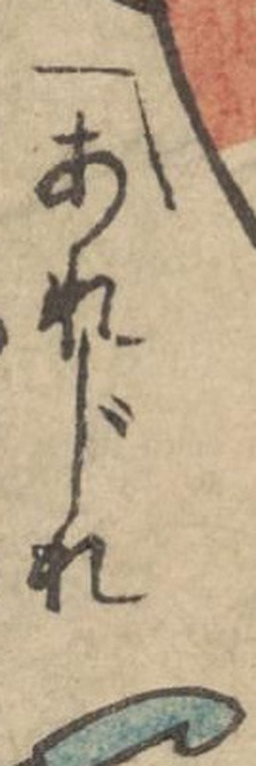〽あれじれ
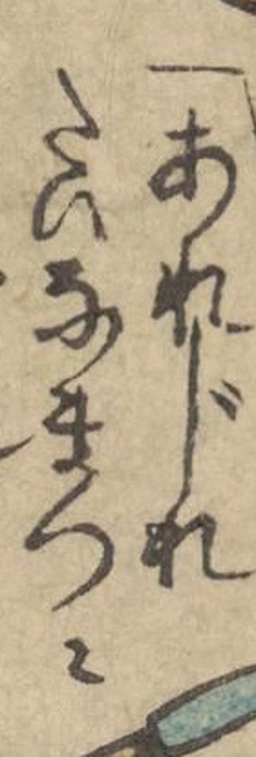たいなまつニ
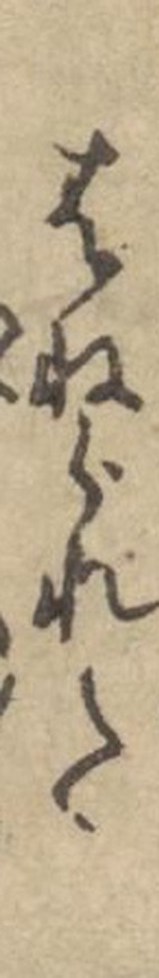はねられた
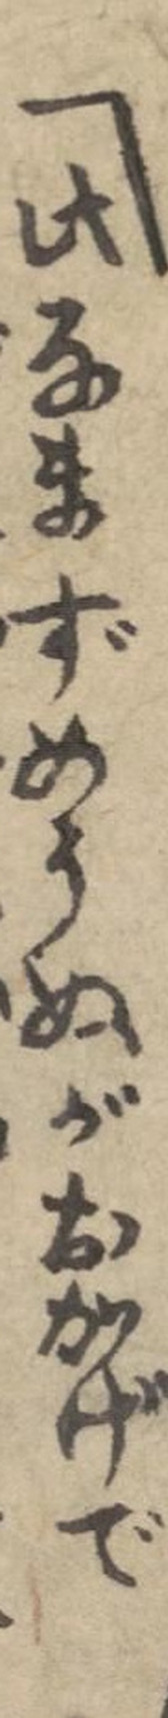〽此なまずめうぬがおかげで
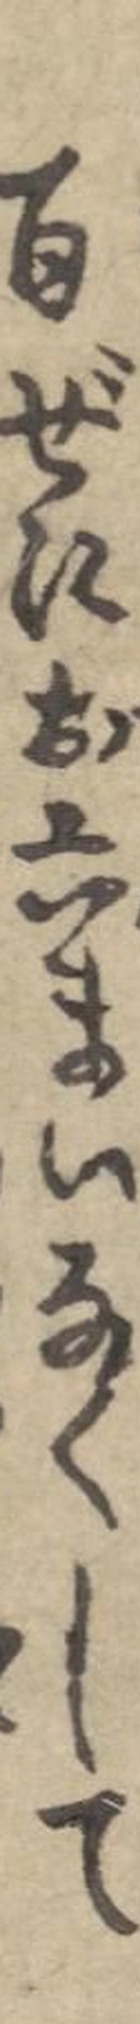百ぜにお六まいなくして
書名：しんよし原大なまづゆらひ
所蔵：東京大学地震研究所図書室 Earthquake Research Institute Library, The University of Tokyo, JAPAN
